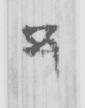邑
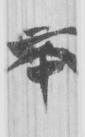不
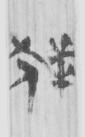幸
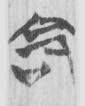命
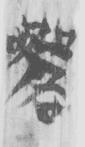{品客}
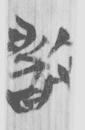敢
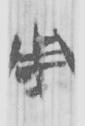用
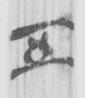五
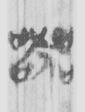器
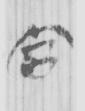宮
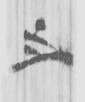之
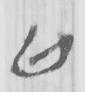㠯（以）
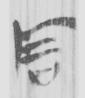石
